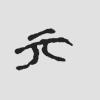亓（其）
